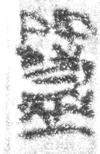簦
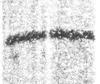一
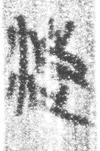○（汲）
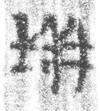○（缾）
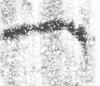一
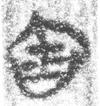缶
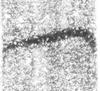一
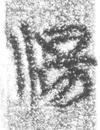湯
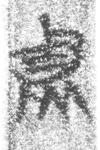鼎
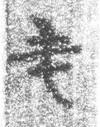屯
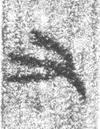又（有）
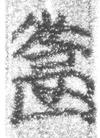盍（蓋）
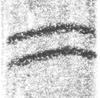二
